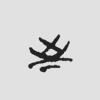至
